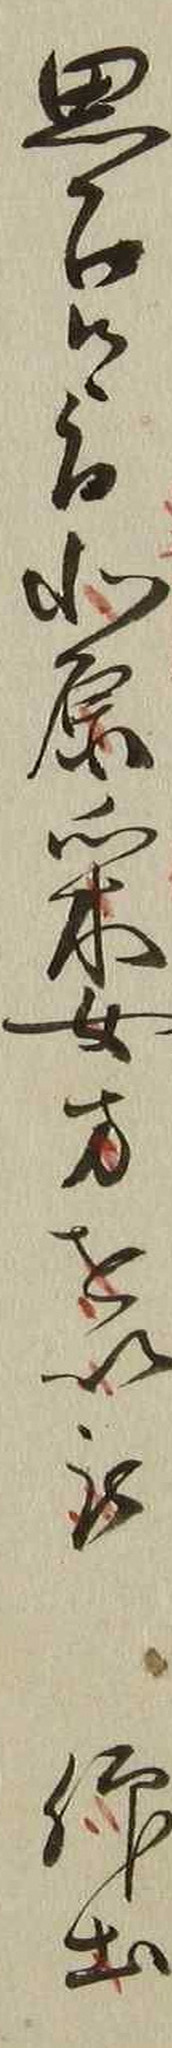思召候旨北原采女方を以被仰出
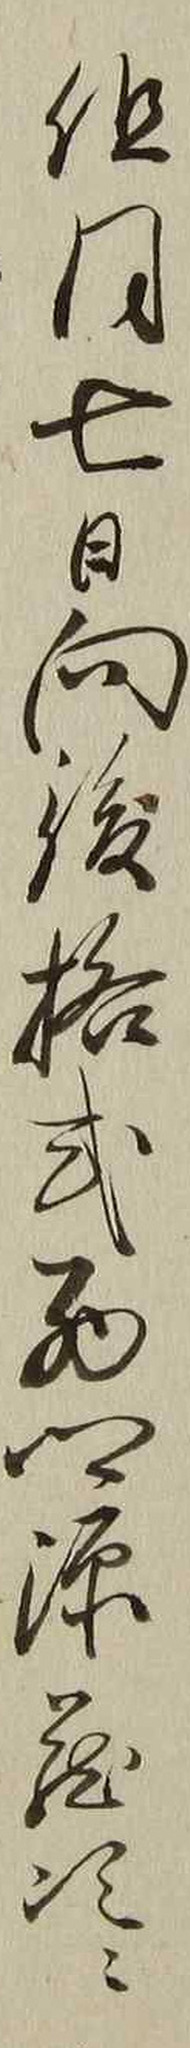但同七日向後格式西卿源蔵次に
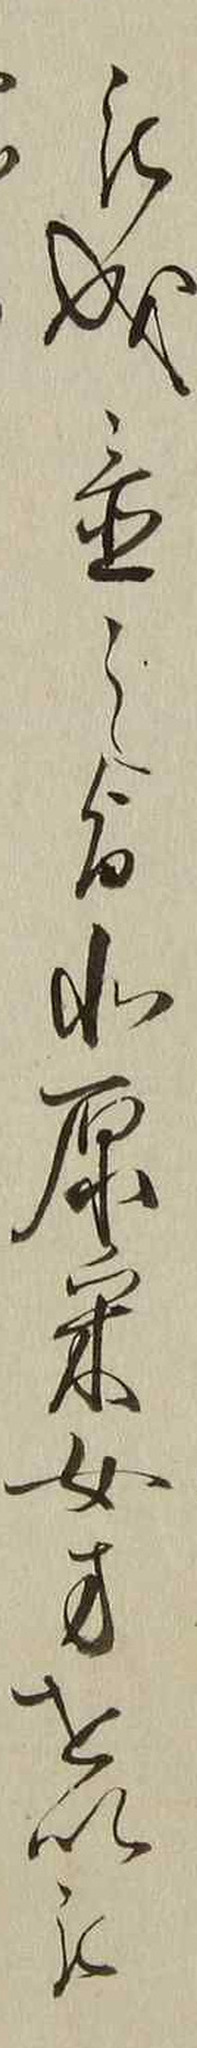被成置之旨北原采女方を以被
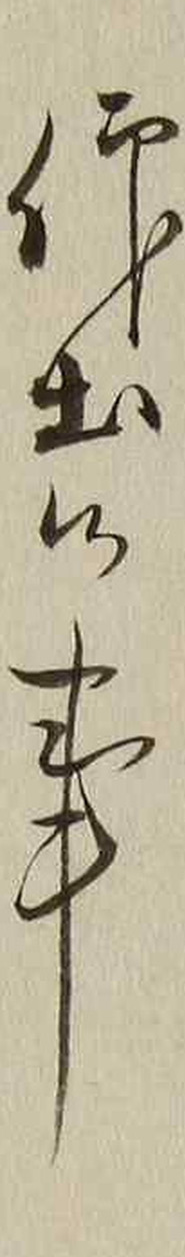仰出候事
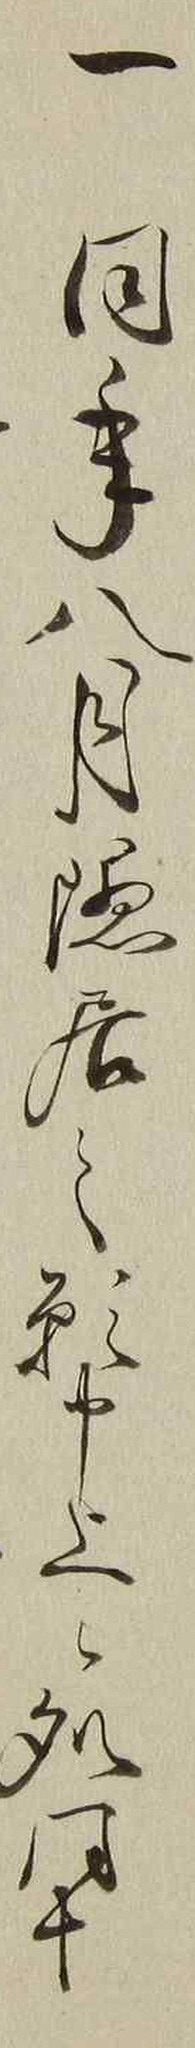一同年八月隠居之願申上候処同十
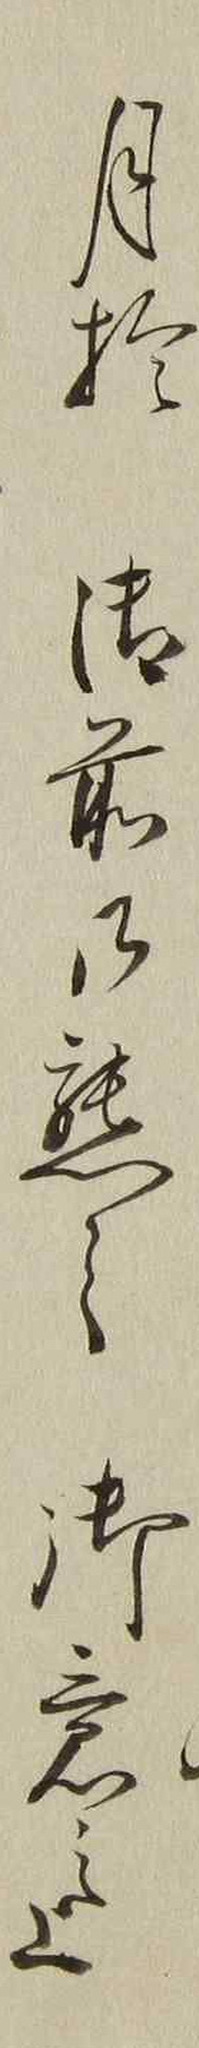月於御前御懇之御意之上
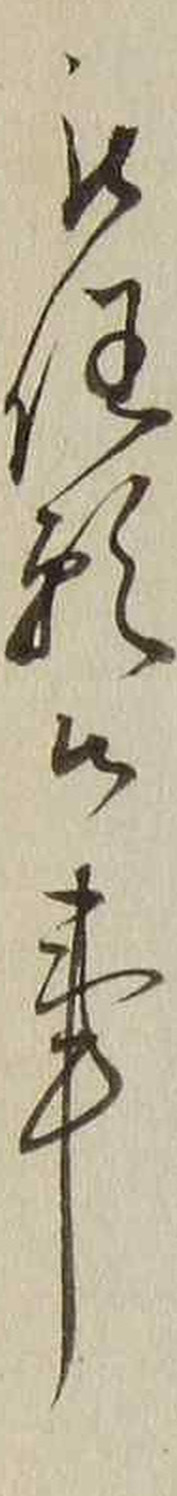被任願候事
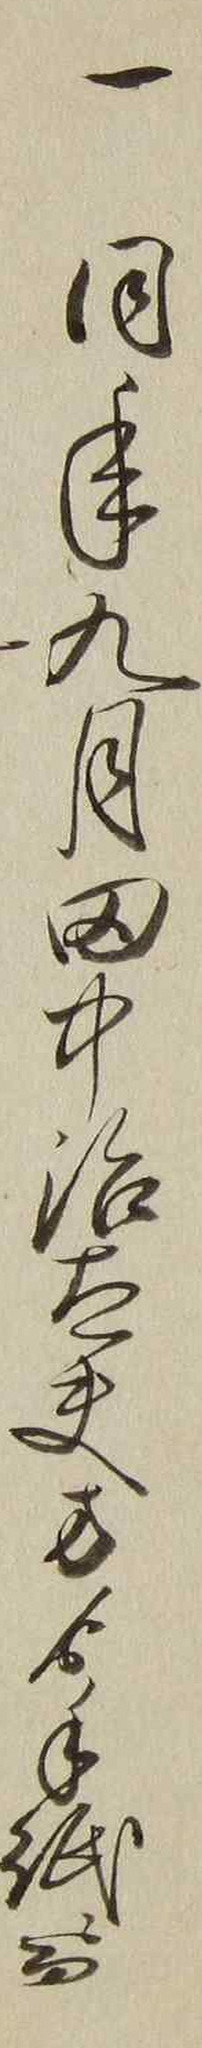一同年九月田中治太夫方ゟ手紙に而
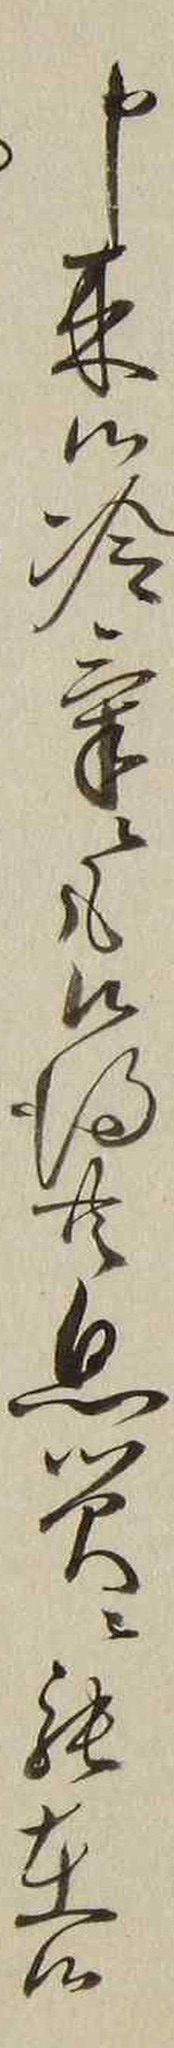申来候冷気にも候得共息災に能在候
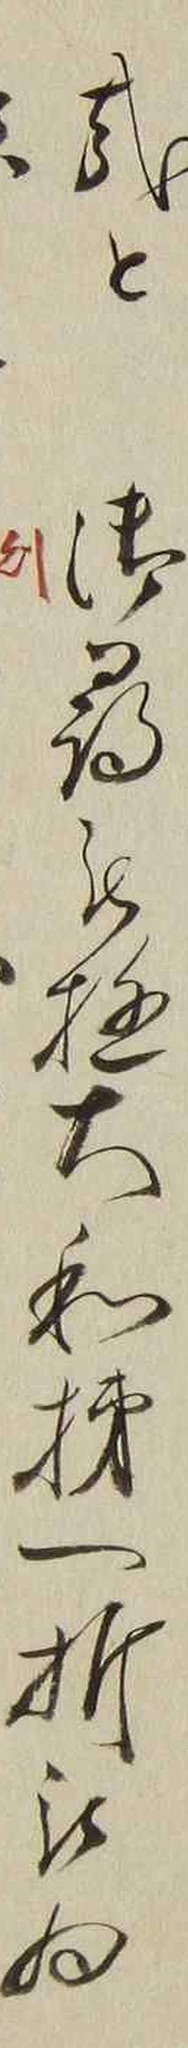哉と御尋被遊大和柿一折被為
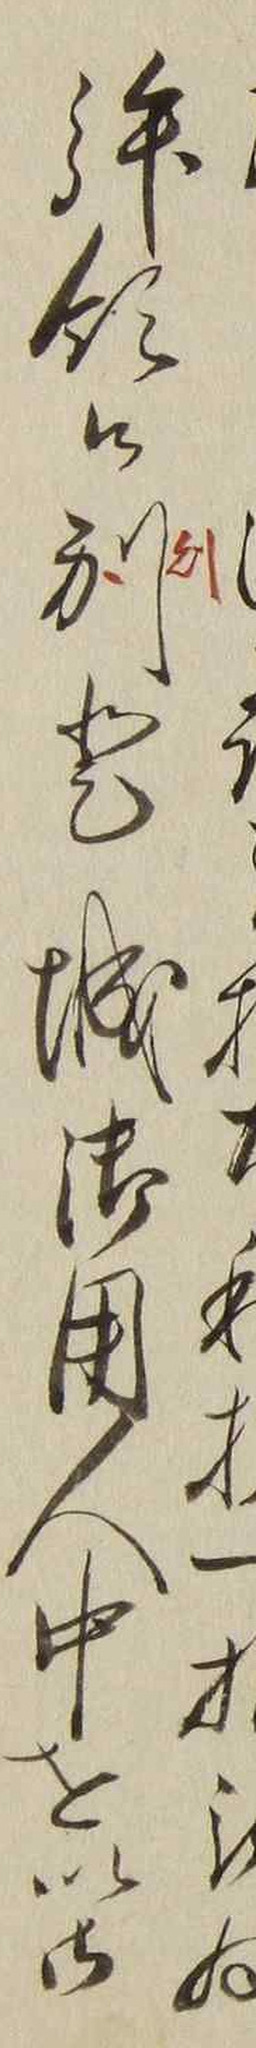拝領別登城御用人中を以御

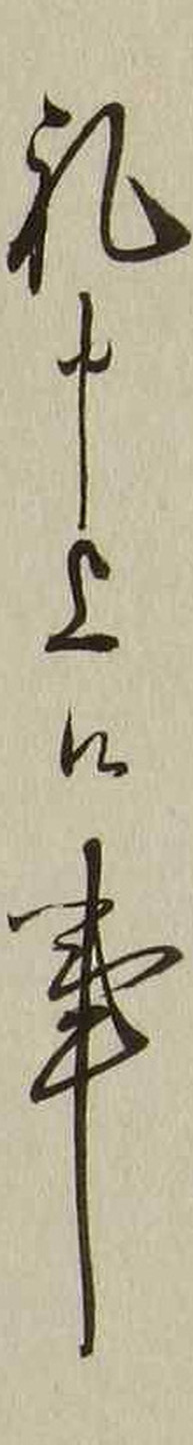礼申上候事
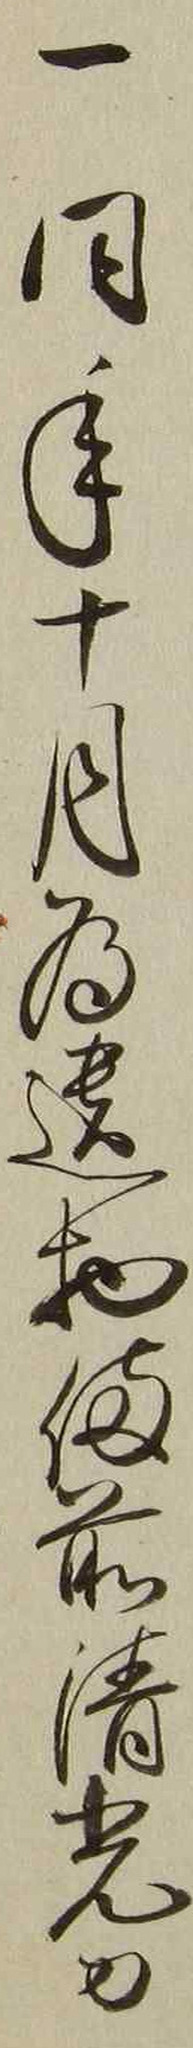一同年十月為遺物備前清光刀
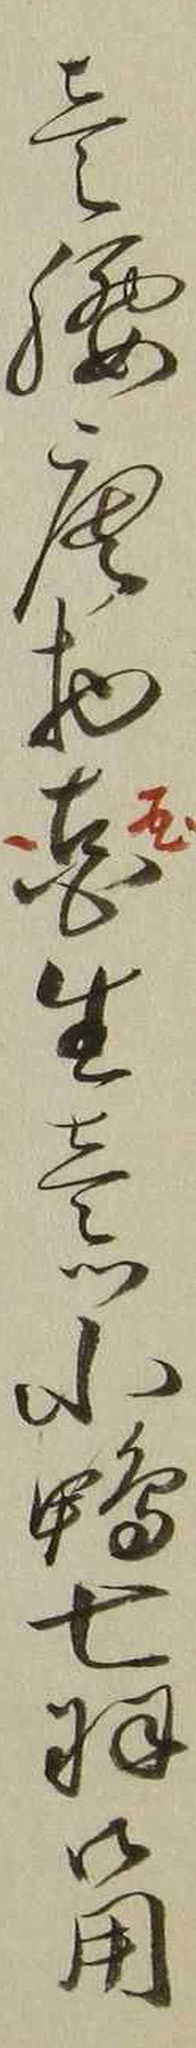壱腰唐物花生壱ッ小鴨七羽御用
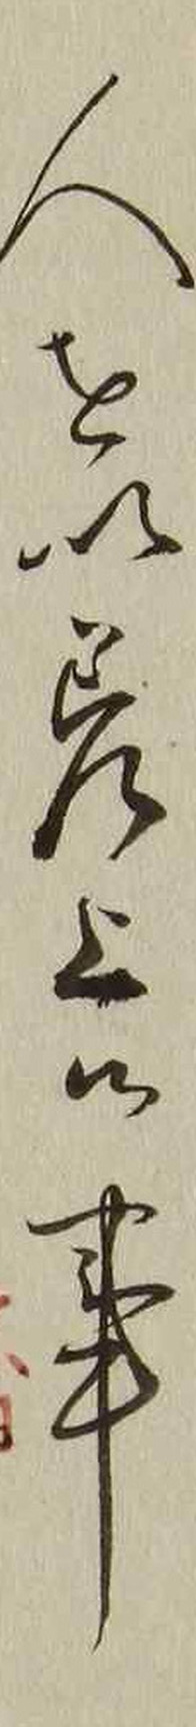人を以差上候事
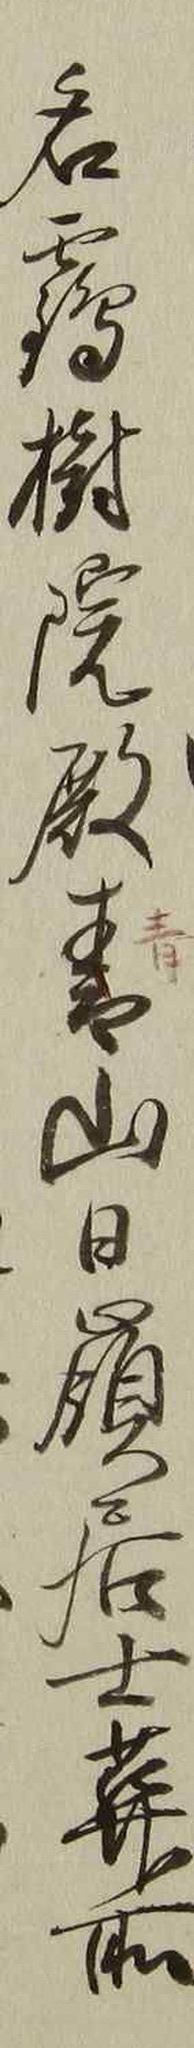名鶴樹院殿青山日嶺居士葬所
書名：諸士系譜　巻之103　か之部11
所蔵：会津若松市立会津図書館
